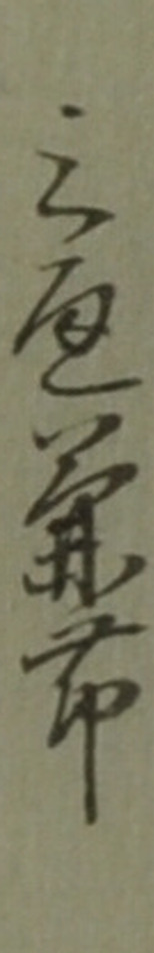之通兼帯

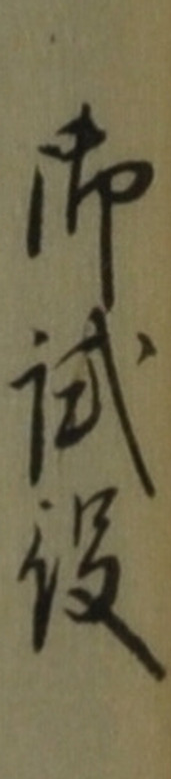御試役
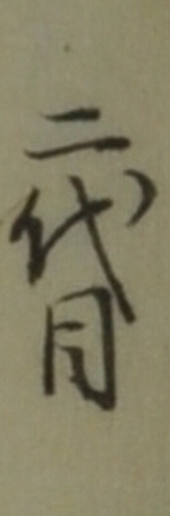二代目
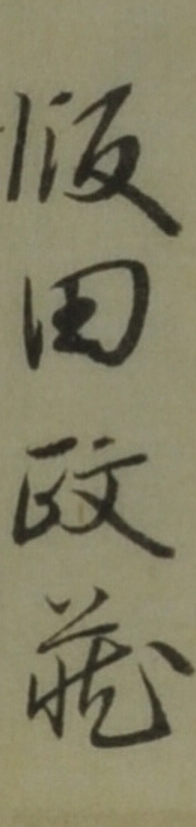飯田政蔵
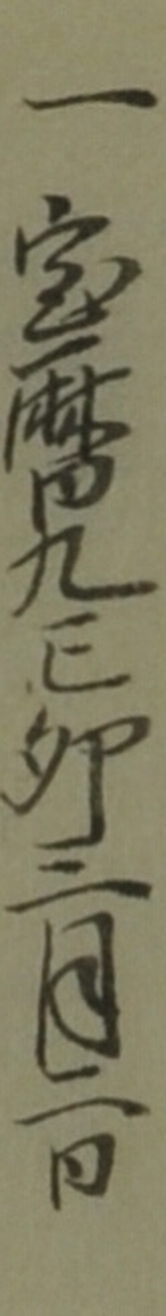一宝暦九己卯三月二日
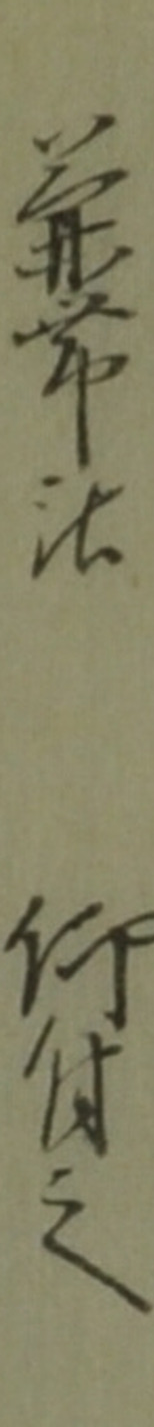兼帯被仰付之
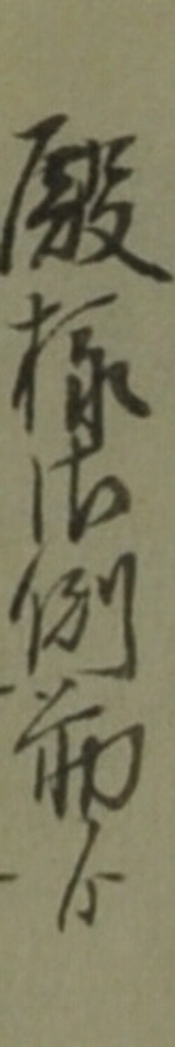殿様御側勤ゟ
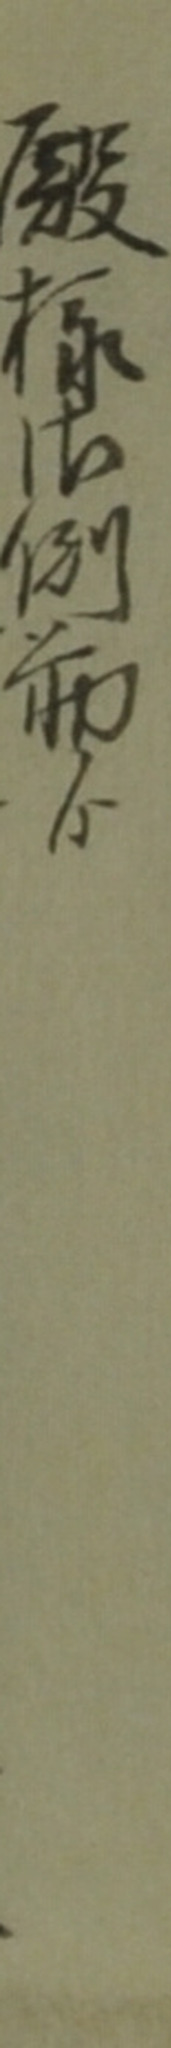殿様御側勤ゟ
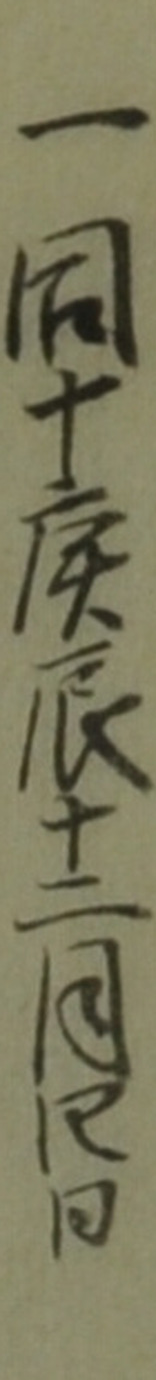一同十庚辰十二月四日
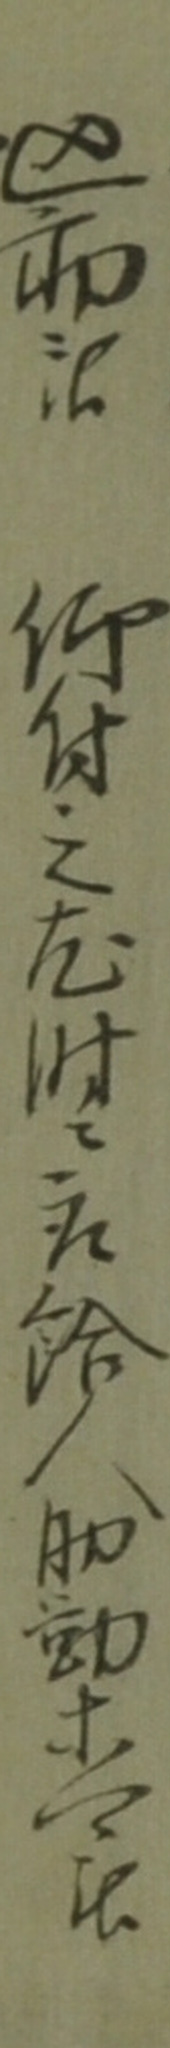込勤被仰付之尤時ニ取給人所勤等可
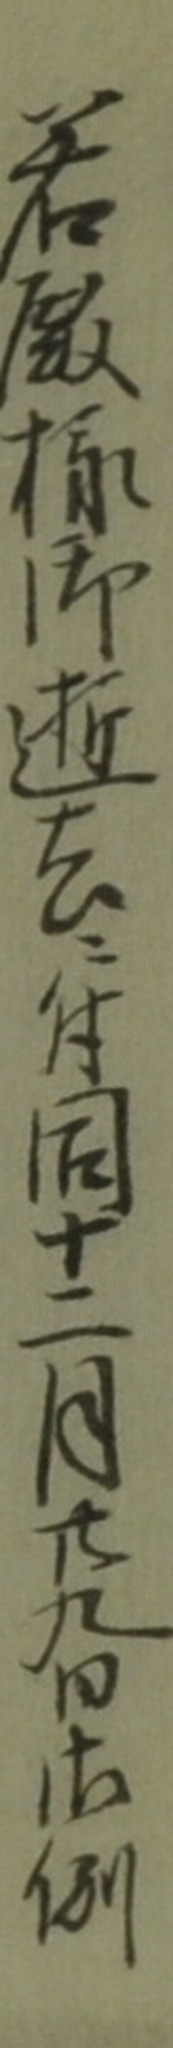若殿様御逝去ニ付同十二月廿九日御側
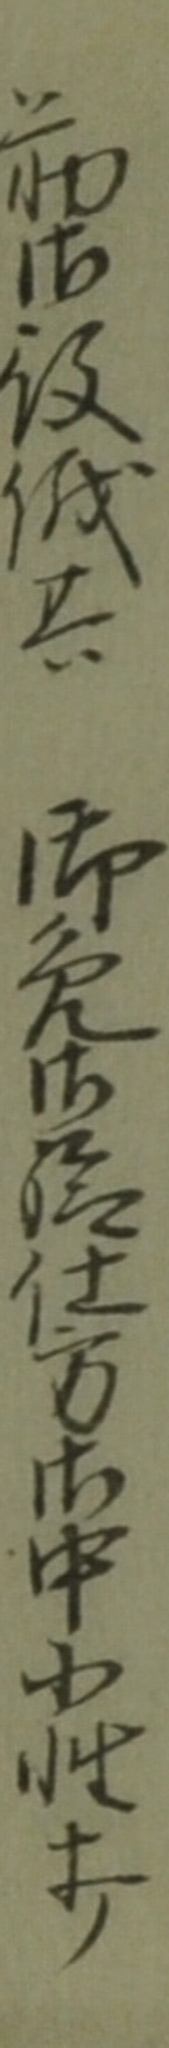勤御役儀共御免御給仕方御中小性打
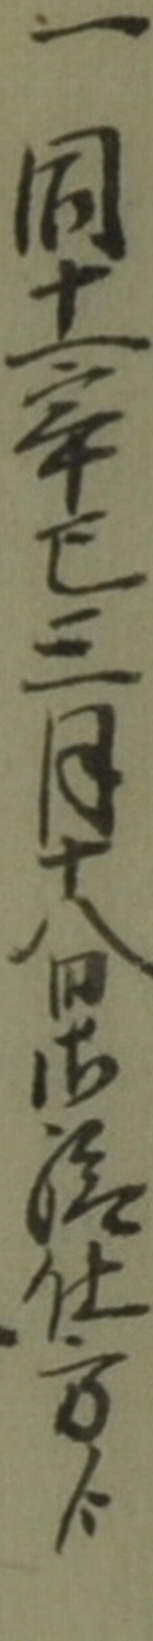一同十一辛巳三月十八日御給仕方ゟ
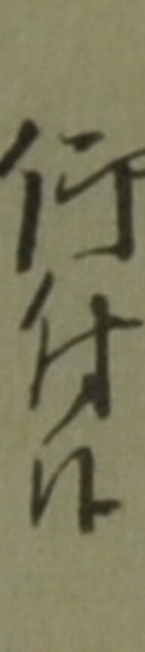仰付候
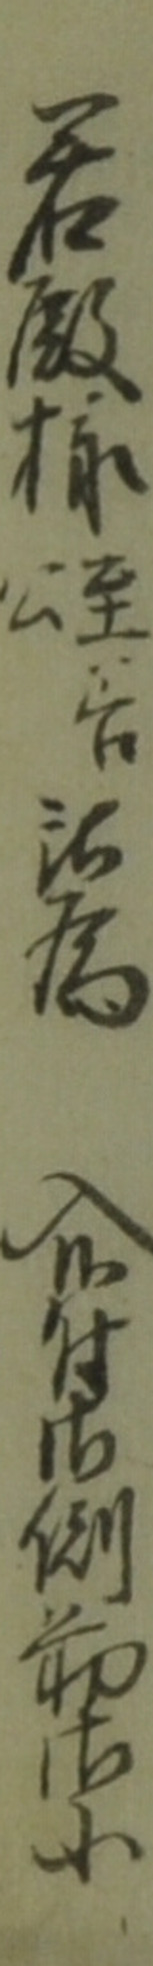若殿様至善公被為入候御側勤御小
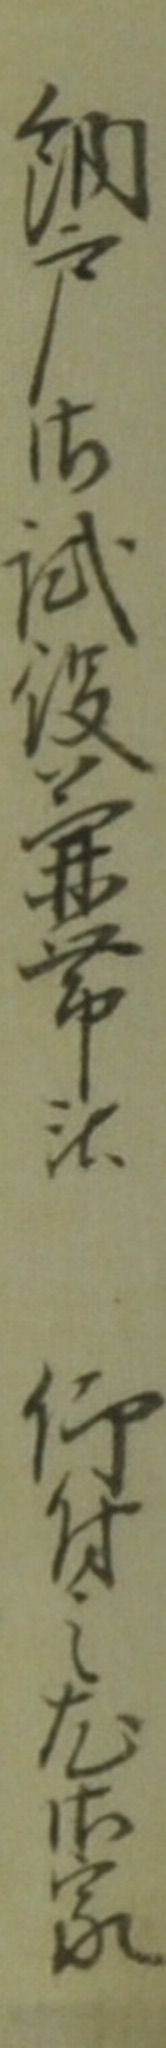納戸御試役兼帯被仰付之尤御家
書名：諸御役代々録（四）
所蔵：伊那市立高遠町図書館・合同会社AMANE
